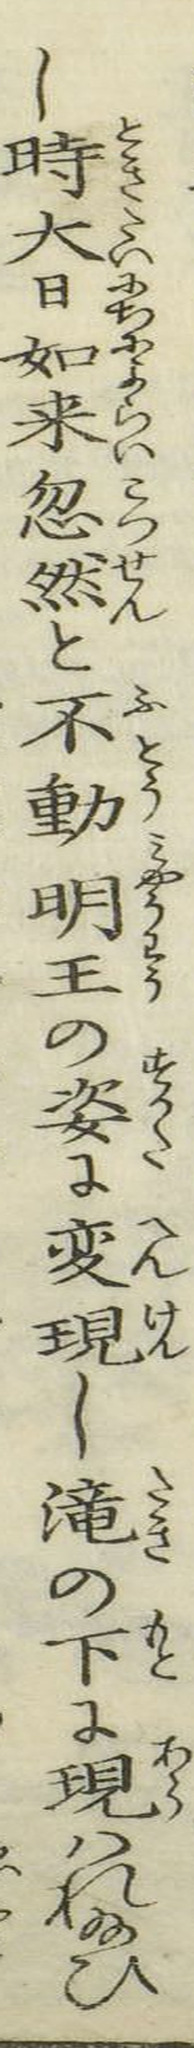し時大日如来忽然と不動明王の姿に変現し滝の下に現はれ給ひ
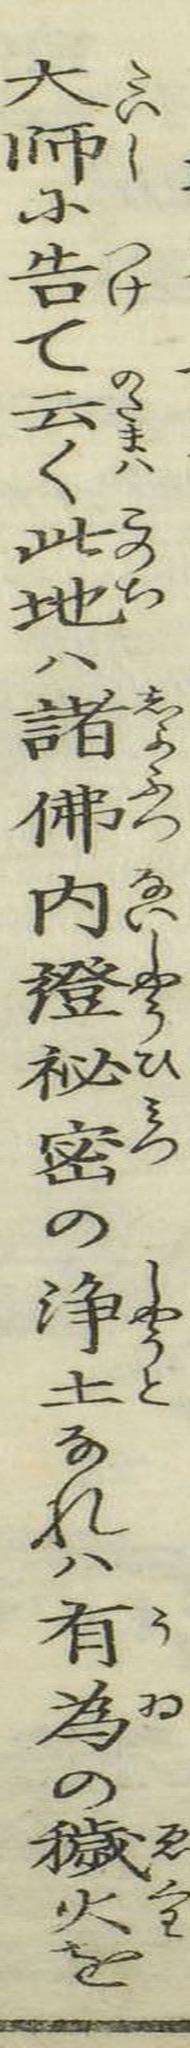大師に告て云く此地は諸佛内證秘密の浄土なれは有為の穢火を
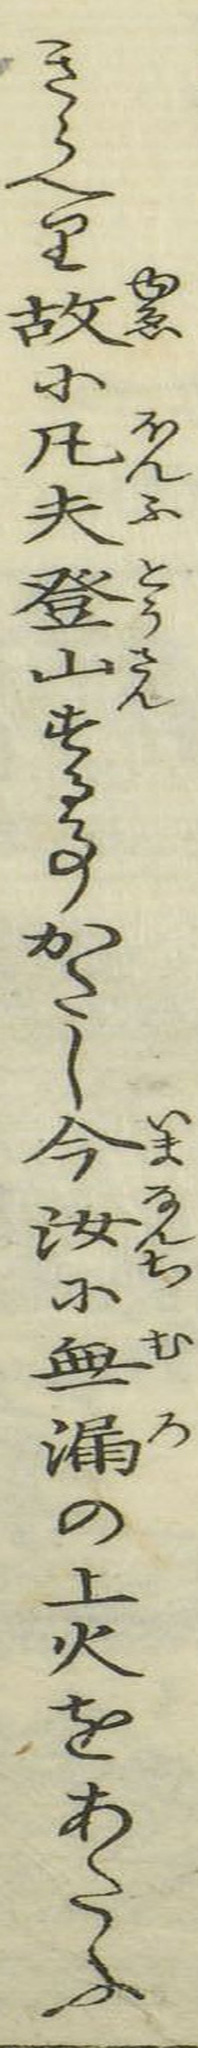きらへり故に凡夫登山する事かたし今汝に無漏の上火をあたふ

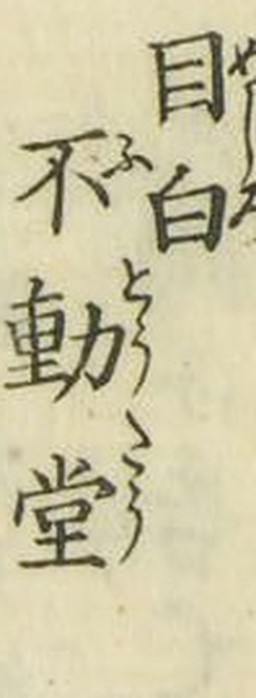不動堂
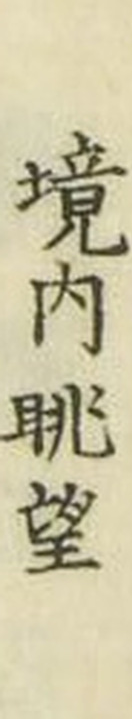境内眺望
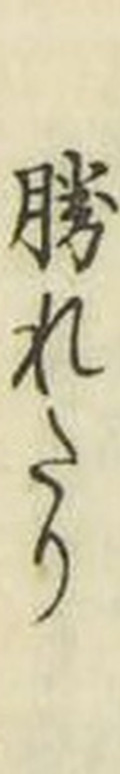勝れたり
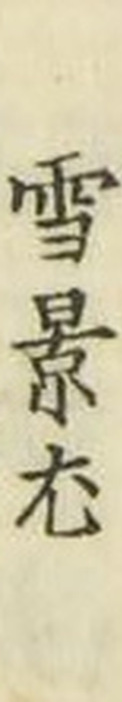雪景尤
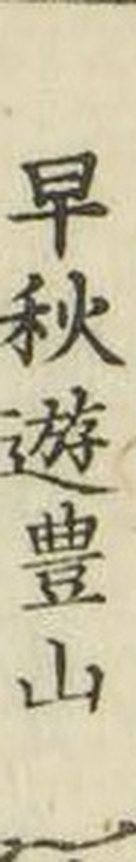早秋遊豊山
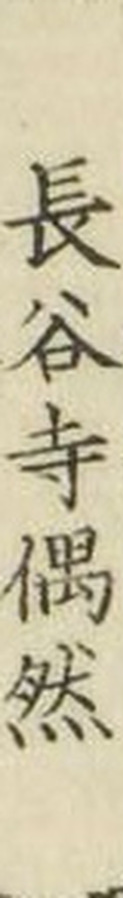長谷寺偶然
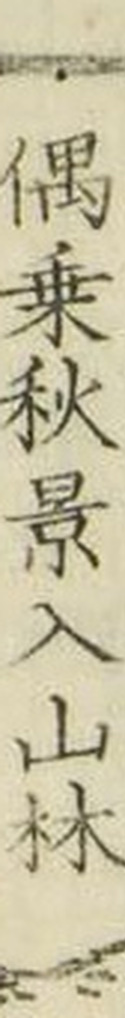偶乗秋景入山林
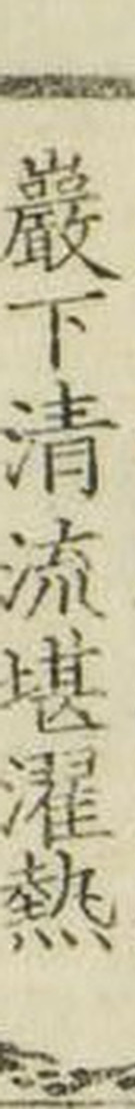巖下清流堪濯熱
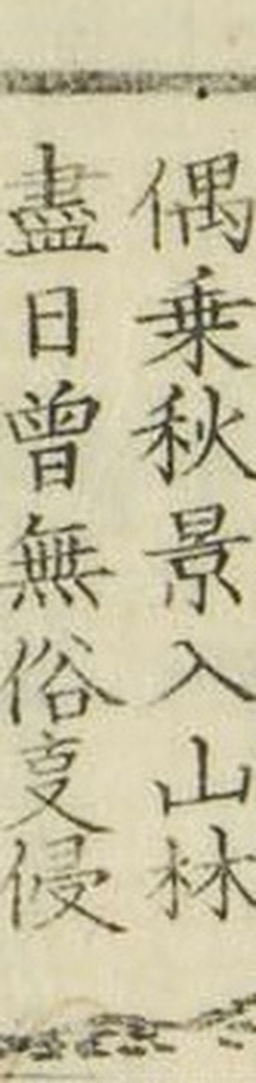盡日曽無俗㕝侵
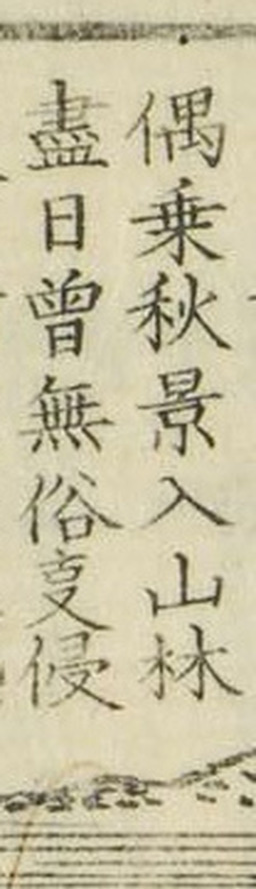盡日曽無俗㕝侵
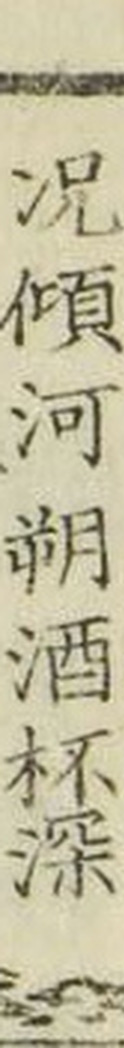况傾河朔酒杯深

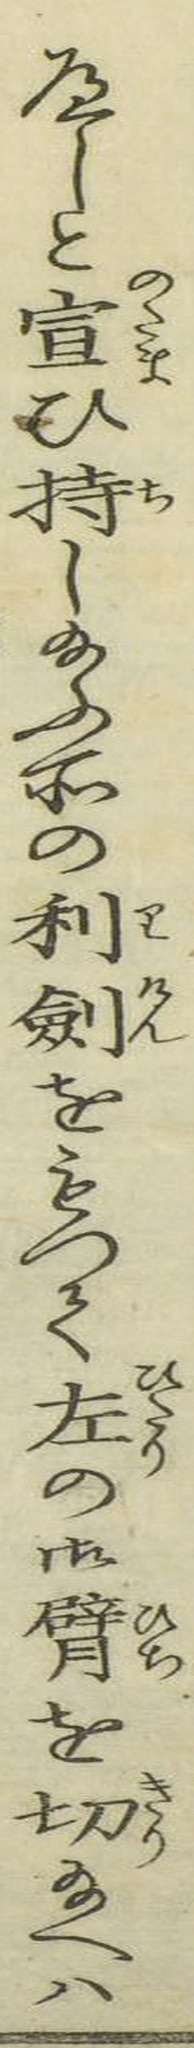へしと宣ひ持し給ふ所の利劍をもつて左の御臂を切給へは
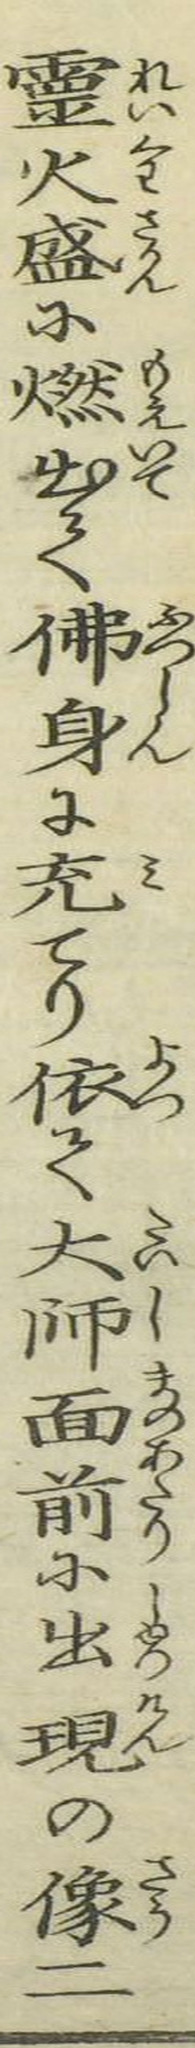霊火盛に燃出て佛身に充てり依て大師面前に出現の像二
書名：江戸名所図会 20巻 巻之12
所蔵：東京学芸大学教育コンテンツアーカイブ
